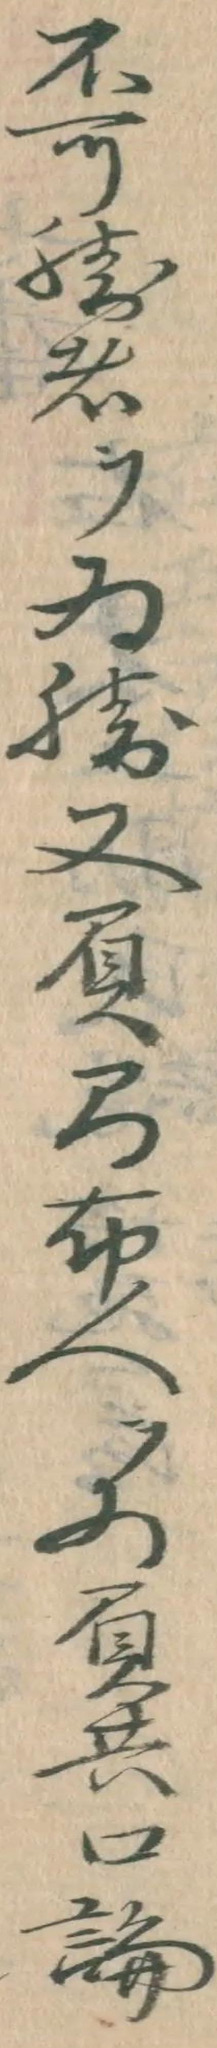不可勝者ヲ為勝又負間布人ヲ為負共口論
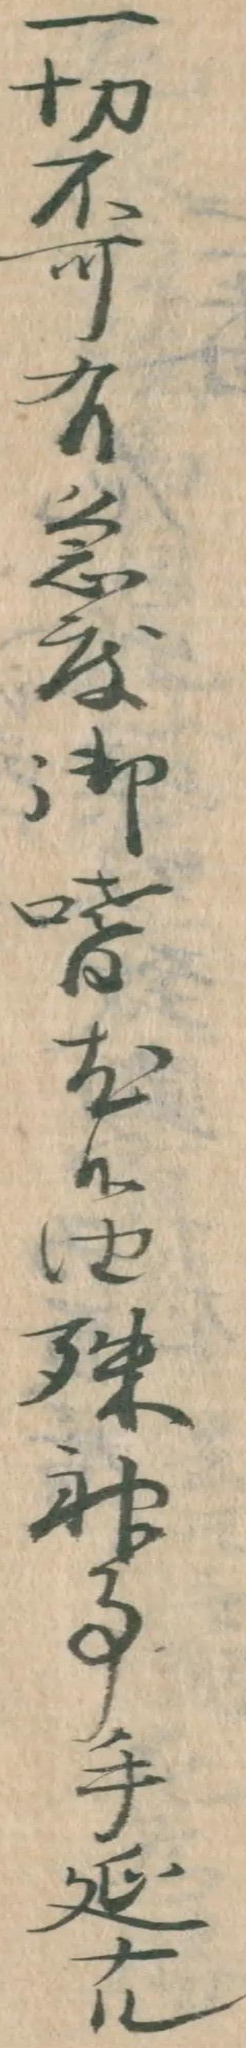一切不可有急度御嗜尤候由殊神事手延ナル
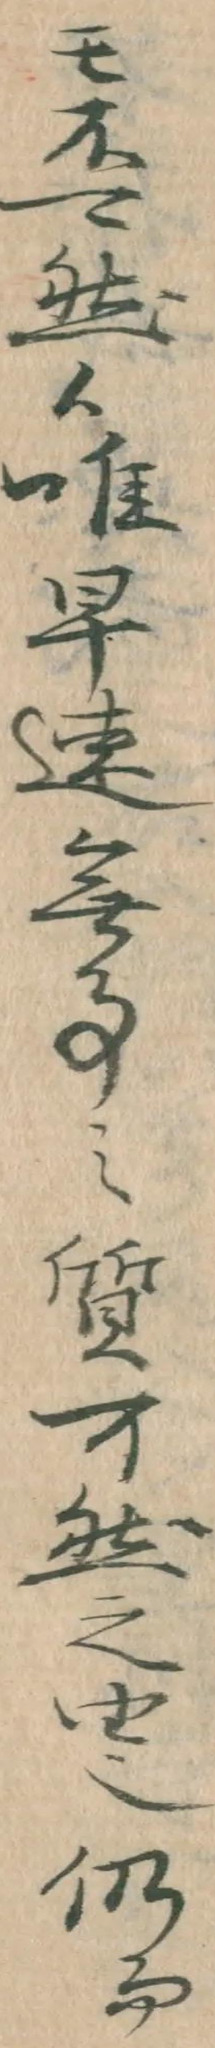モ不可然候唯早速無事之質可然之由也仍而
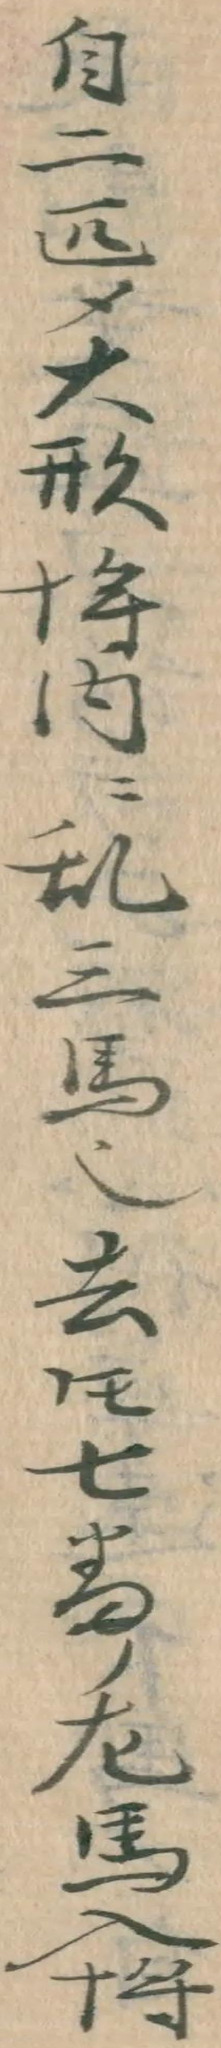自二匹シテ大形埒内ニ乱三馬也去トモ七番ノ左馬入埒
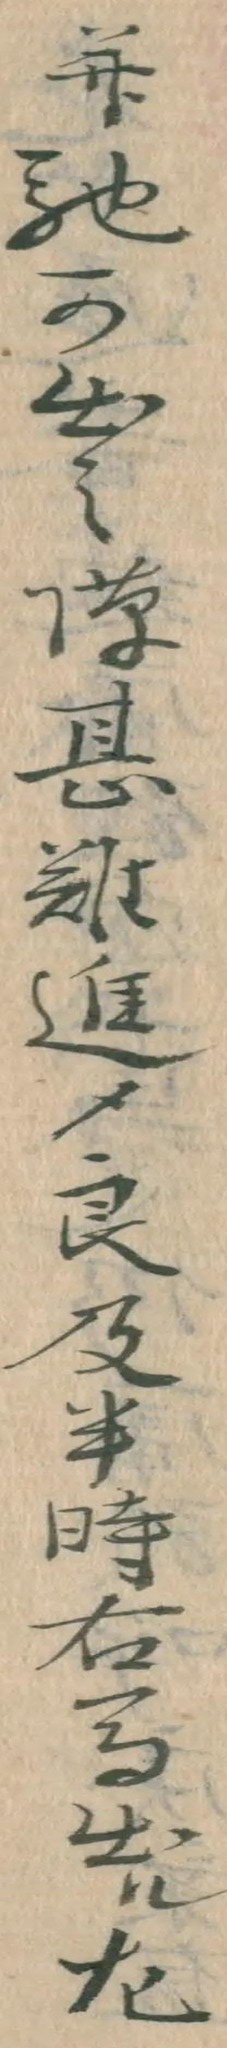并馳可出之隙甚難進シテ良及半時右馬出ル左
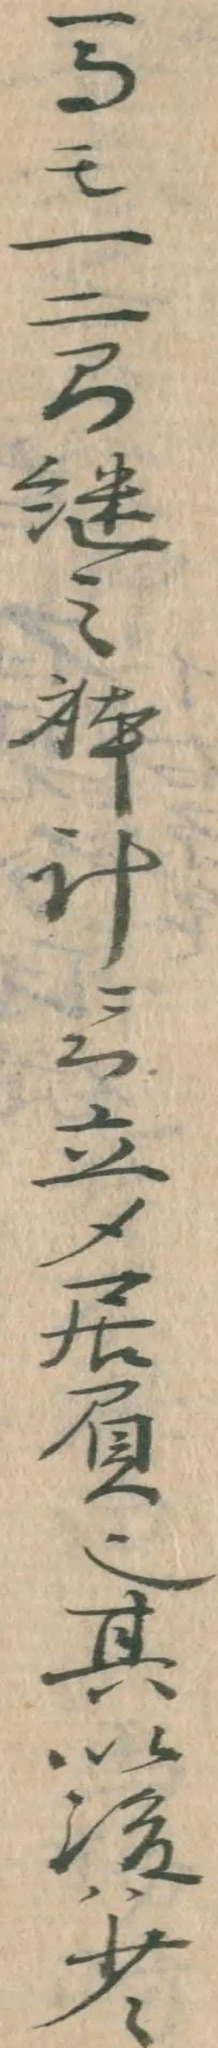馬モ一二間継之体計ニ而立シテ居負也其以後ハ少々
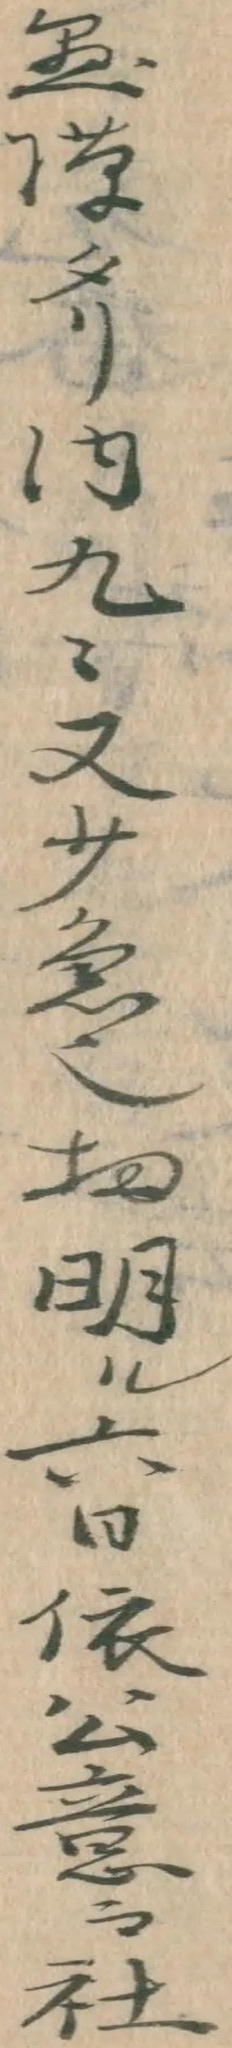懸隙タリ内九々又少急也扨明ル六日依公意而社
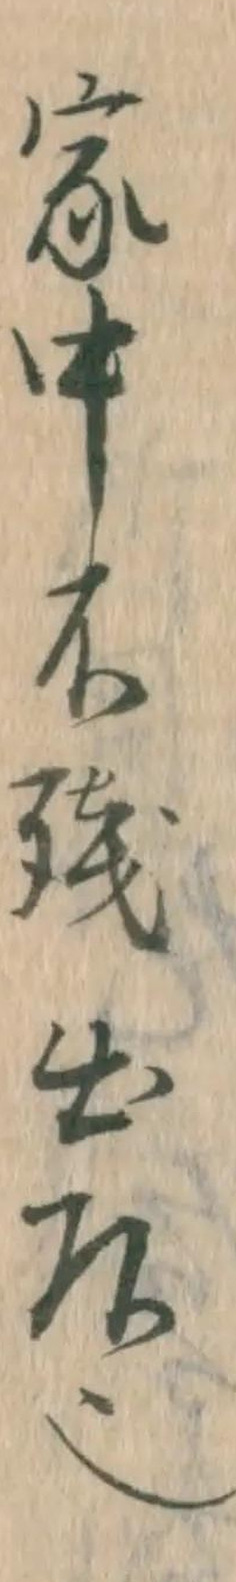家中不残出頭也
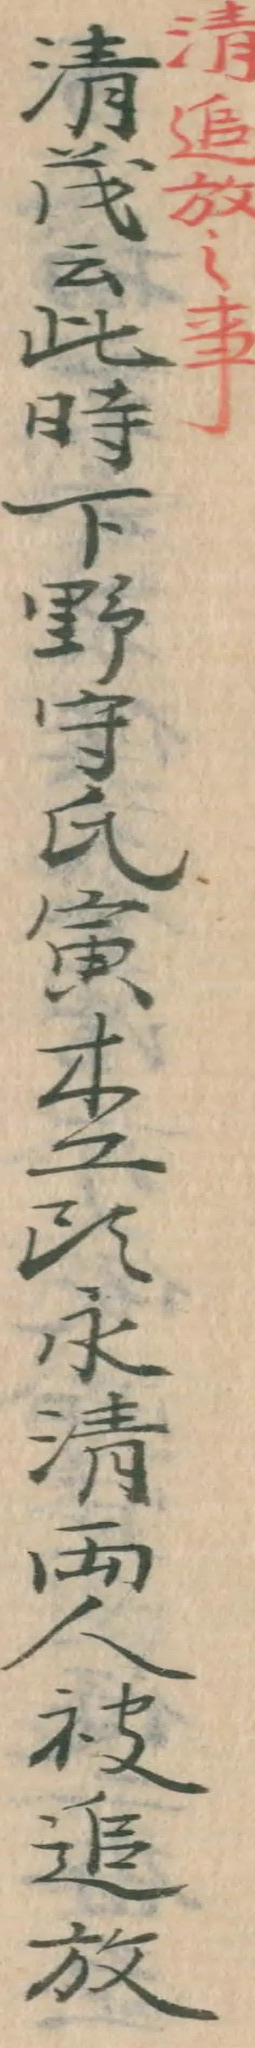清茂云此時下野守氏寅木工頭永清両人被追放
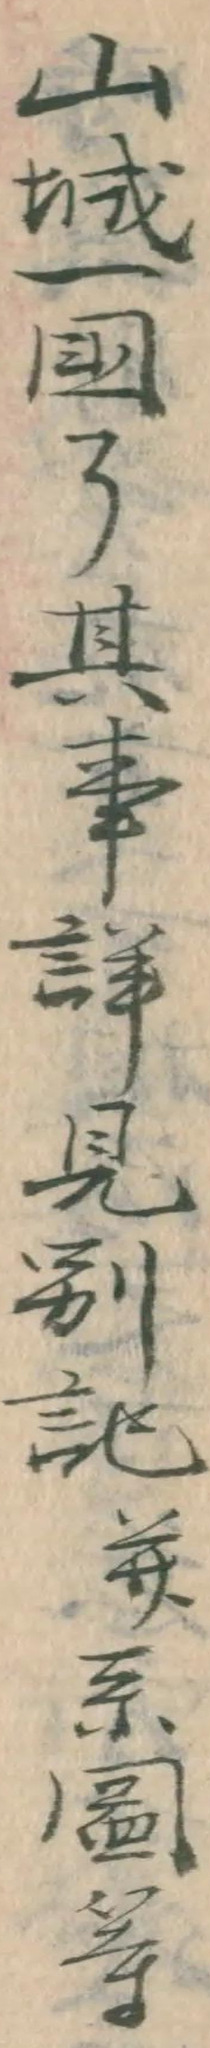山城一国了其事詳見別記并系図等
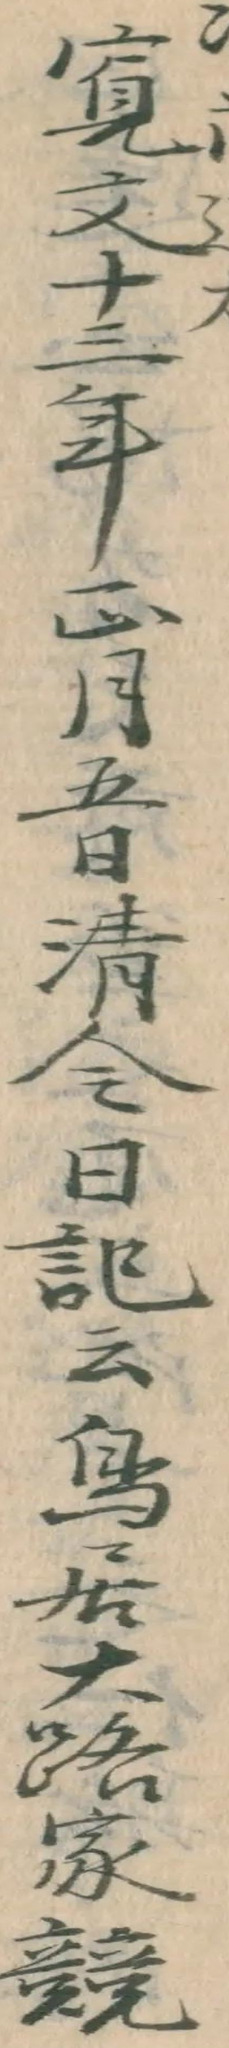寛文十三年正月五日清令日記云鳥居大路家競
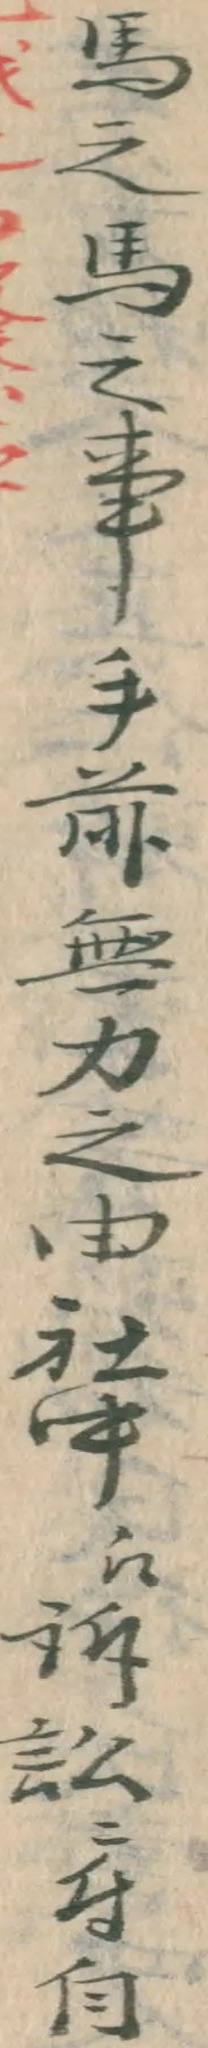馬之馬之事手前無力之由社中江訴訟ニ付自
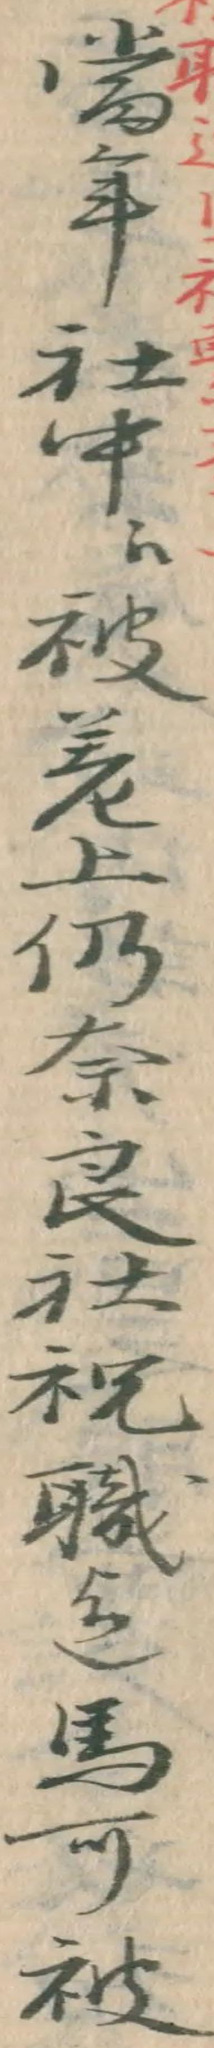当年社中江被差上仍奈良社祝職迄馬可被
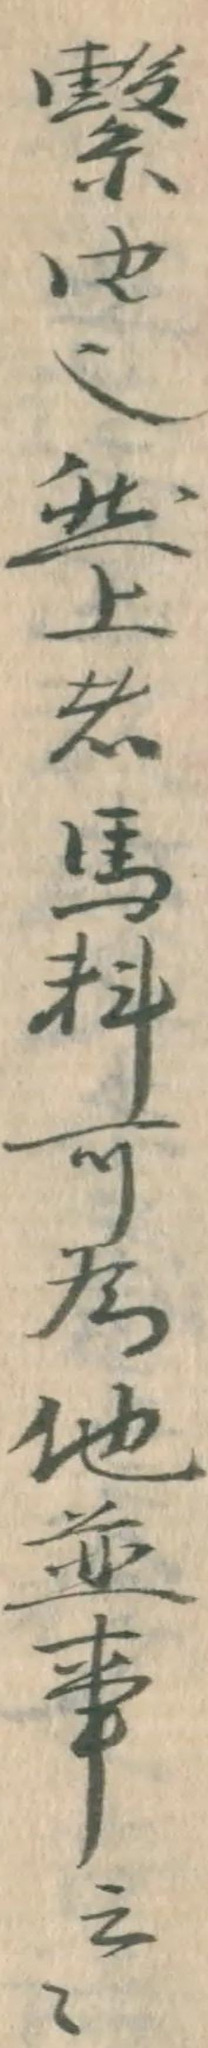繋由也然上者馬料可為他並事云々
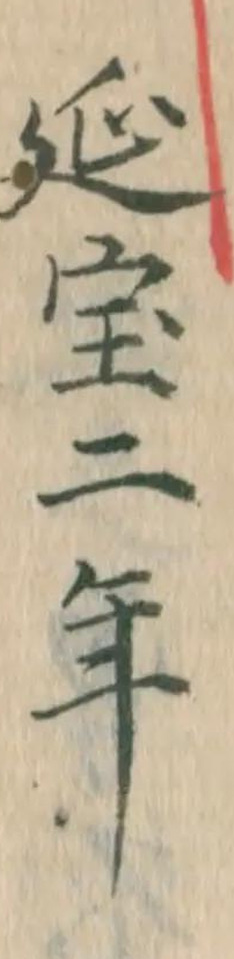延宝二年
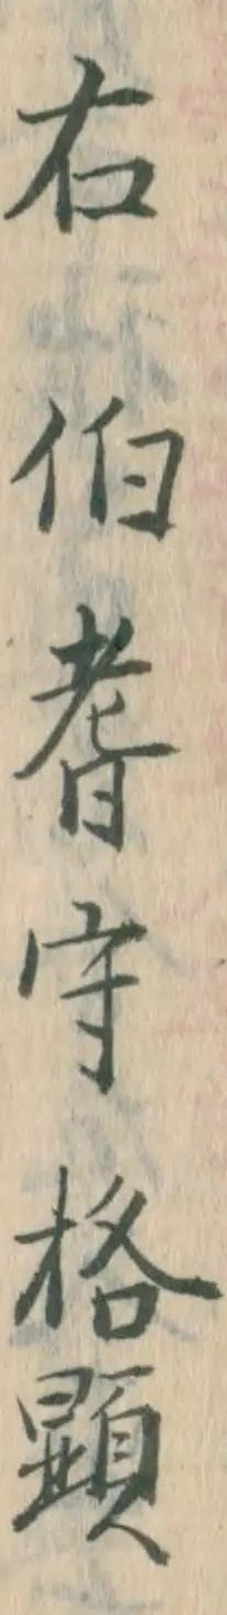右伯耆守格顕
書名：賀茂社記録. 第10冊
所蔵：国立国会図書館 National Diet Library, JAPAN
